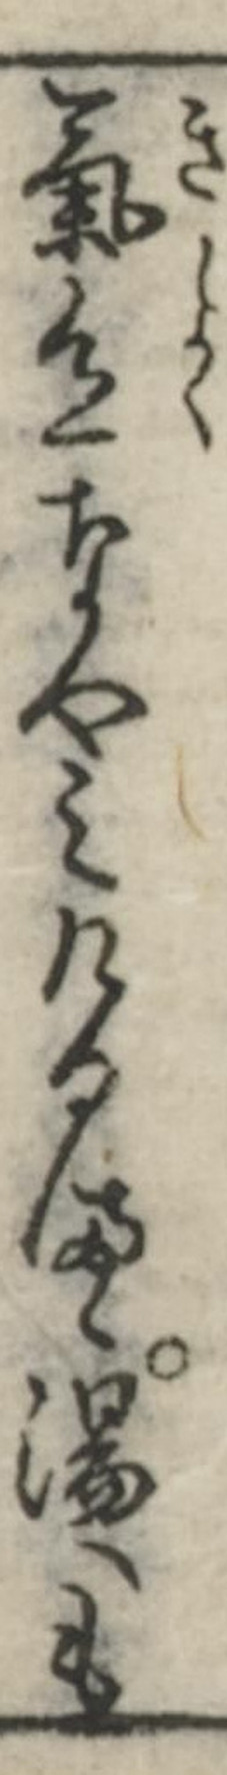気色なやみけるまゝ。湯へも

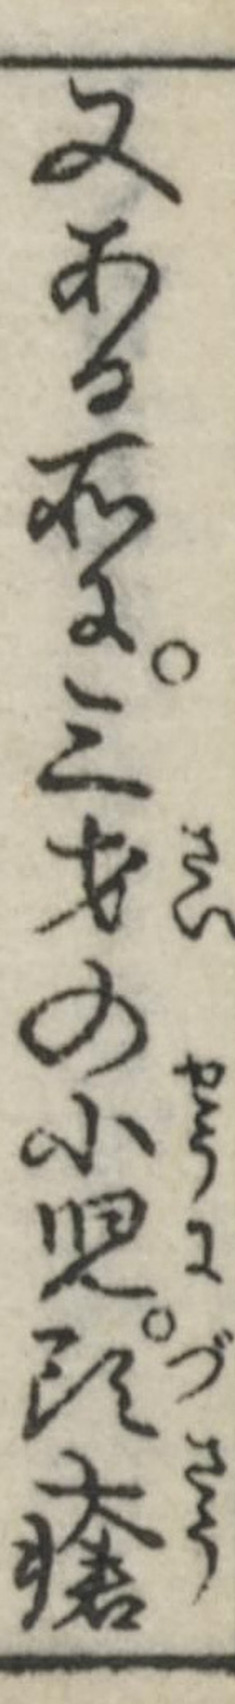又ある所に。三才の小児。頭瘡
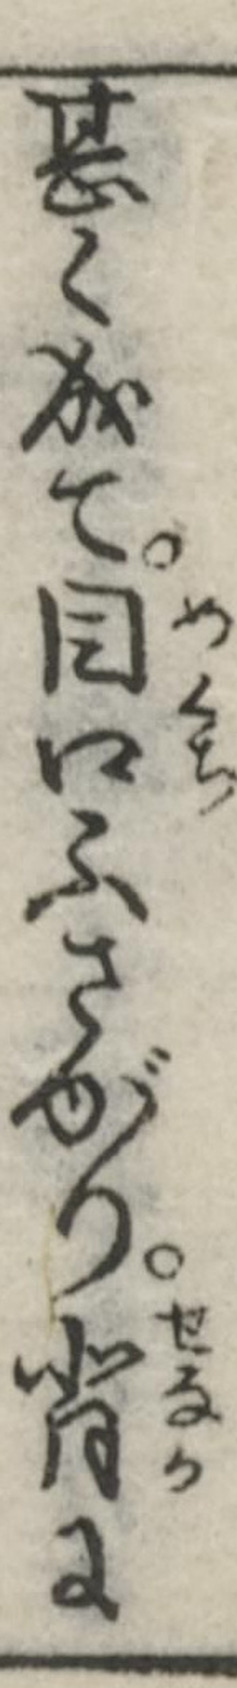甚く成て。目口ふさがり。背に
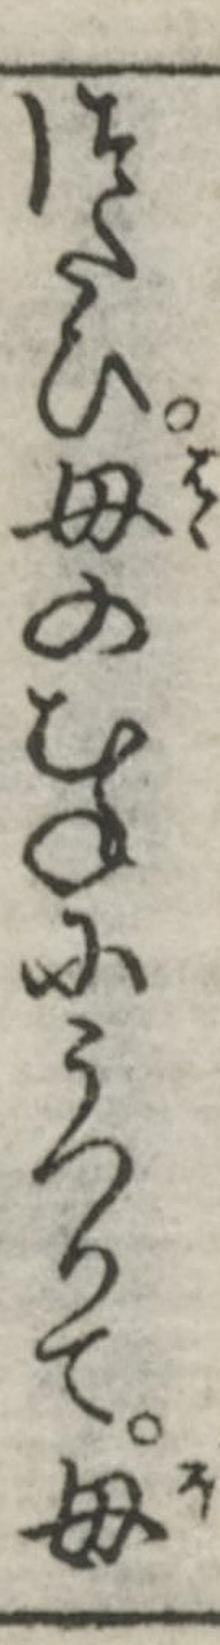つたひ。母のむねにうつりて。母
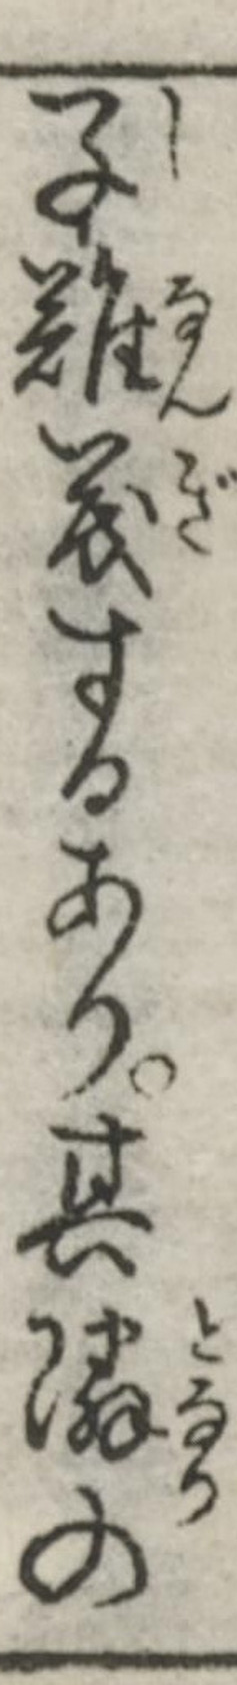子難義するあり。其隣の
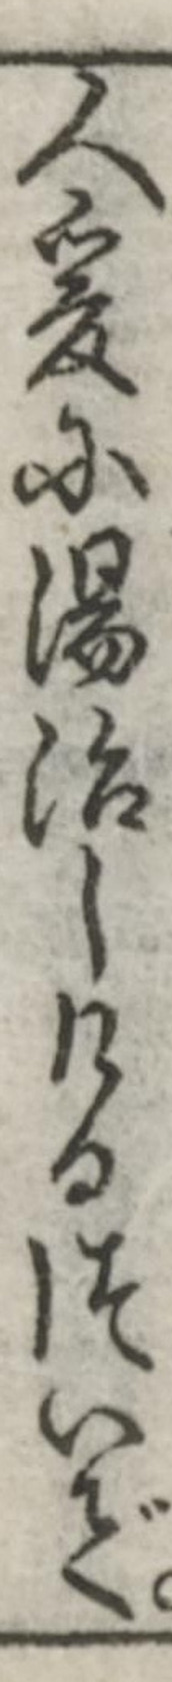人。爰に湯治しけるついで。
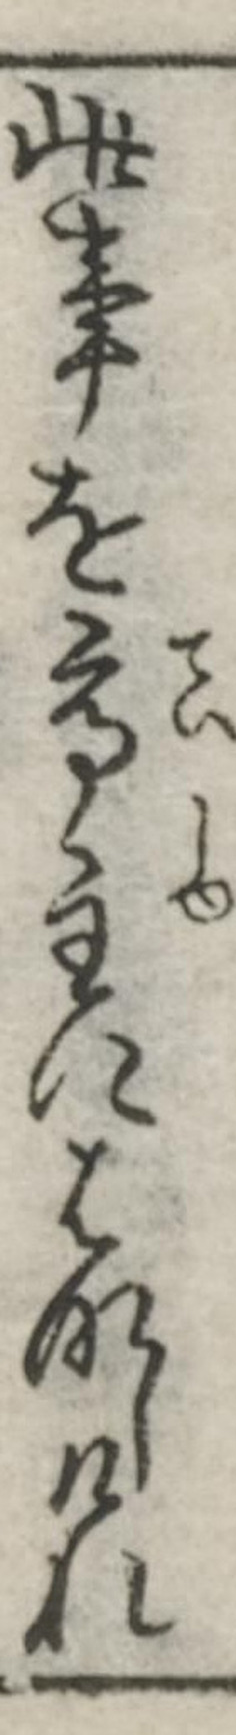此事を亭主にはなしけれ
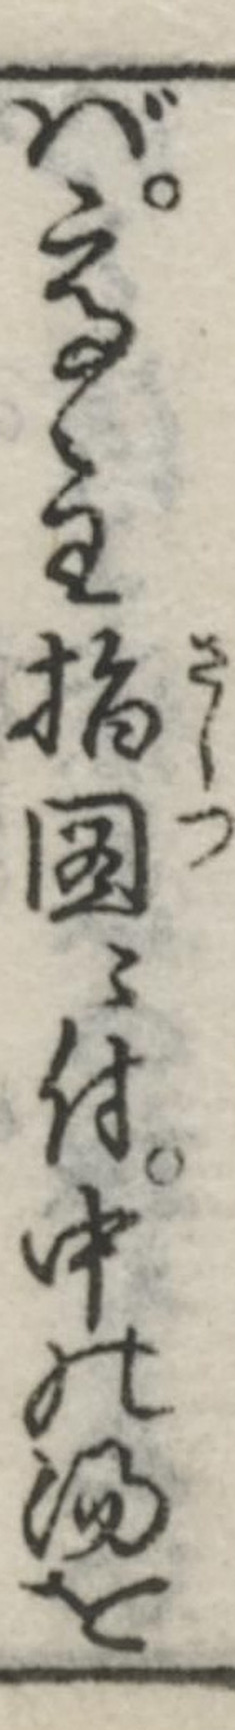ば。亭主指図に付。中の湯を
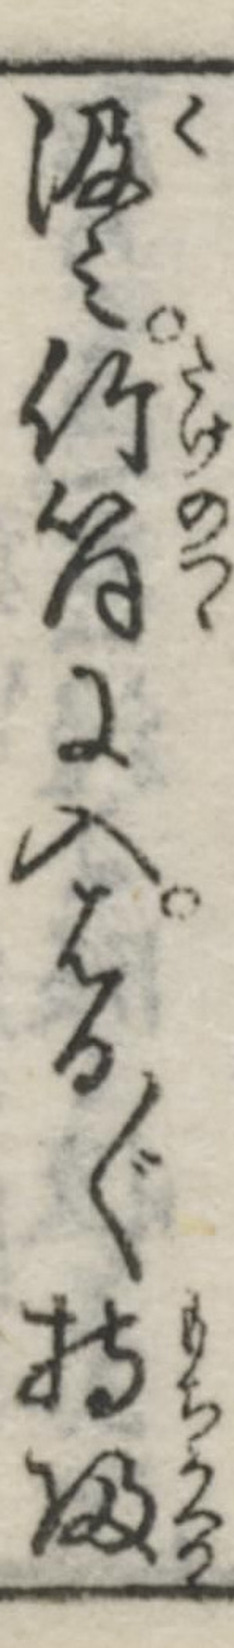汲み。竹筒に入。はる〴〵持帰
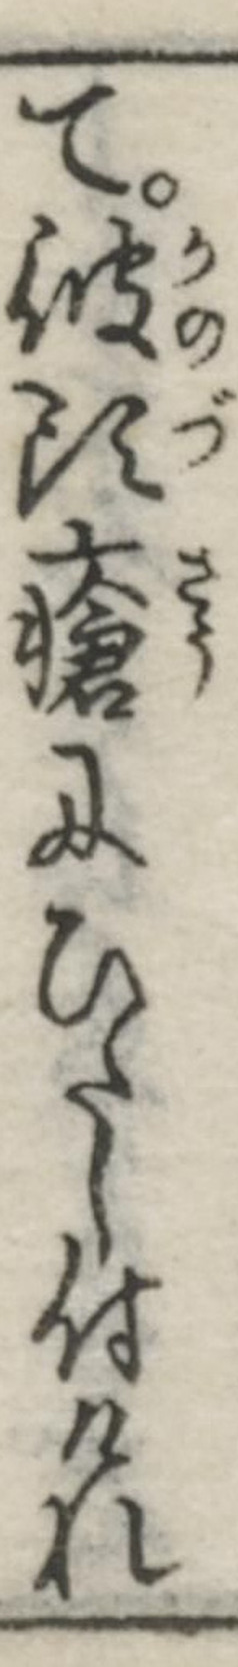て。彼頭瘡にひたし付けれ
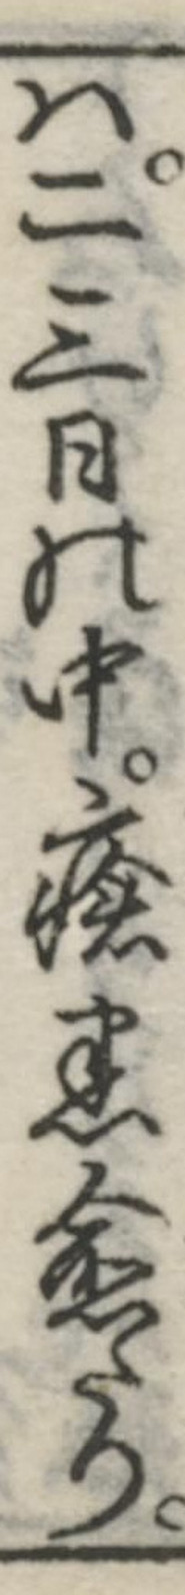は。二三日の中。瘡悉癒たり。
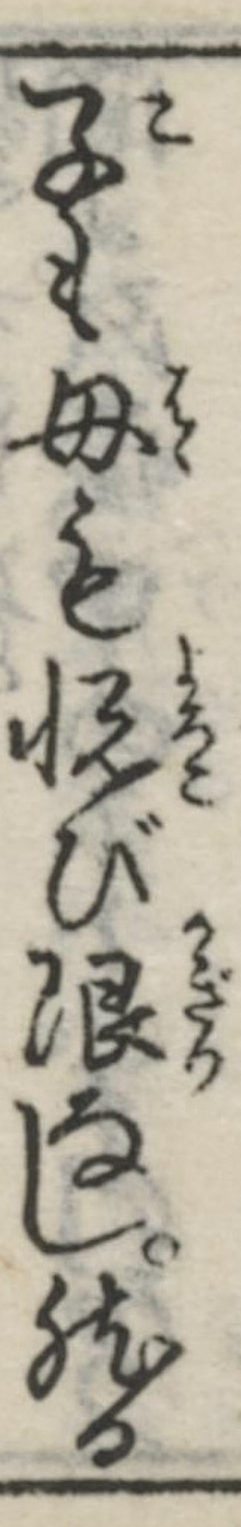子も母も悦び限なし。然る
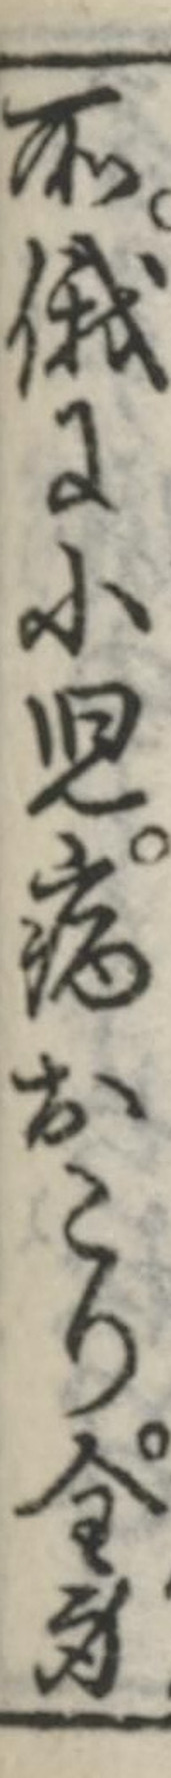所。俄に小児。病おこり。全身
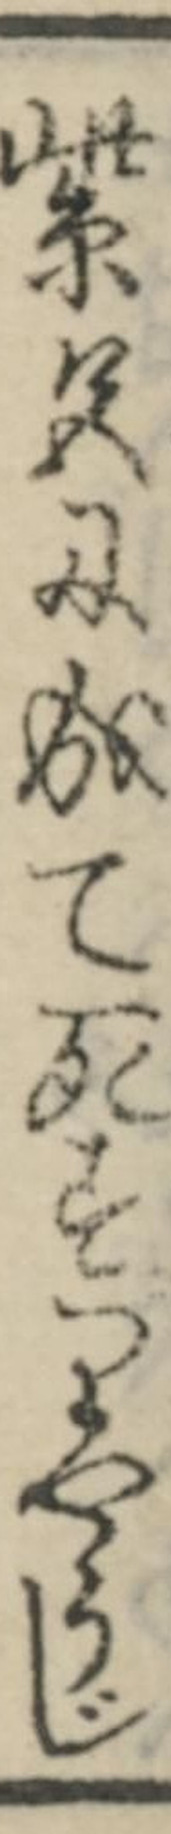紫色に成て死す。りやうじ
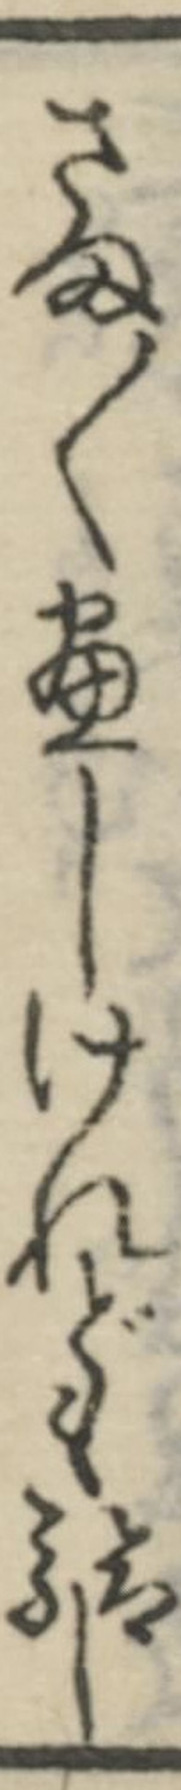さま〳〵尽しけれども験し
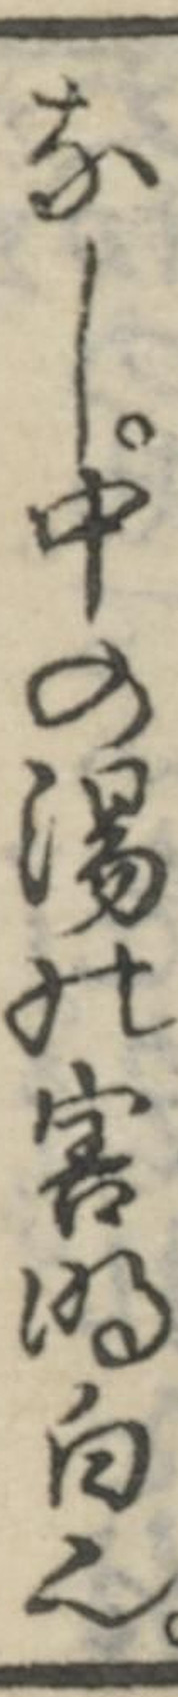なし。中の湯の害明白也。
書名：但州城崎浴湯辧
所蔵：東京大学地震研究所図書室 Earthquake Research Institute Library, The University of Tokyo, JAPAN
